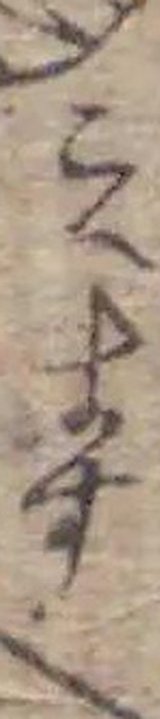こへます
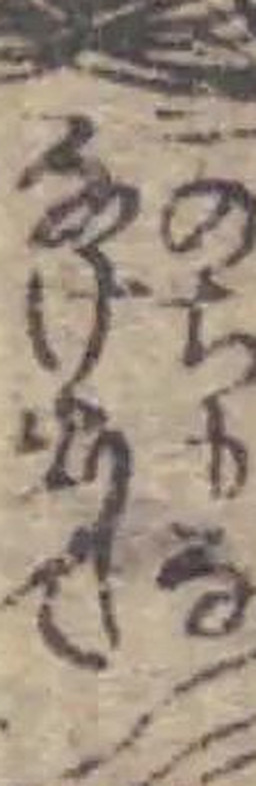なけ出して
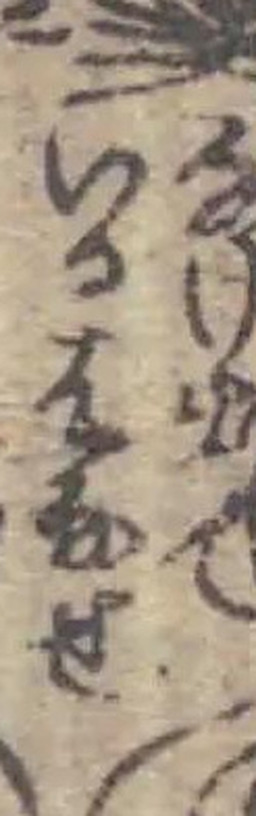いるはなせ
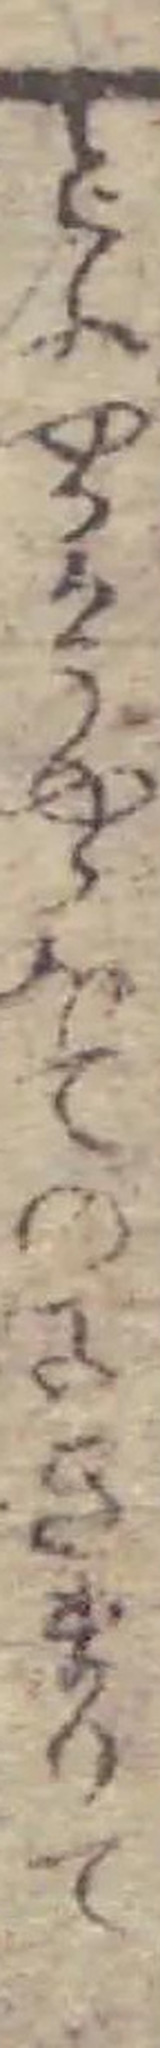どふやらかうやらほてのにきまりて
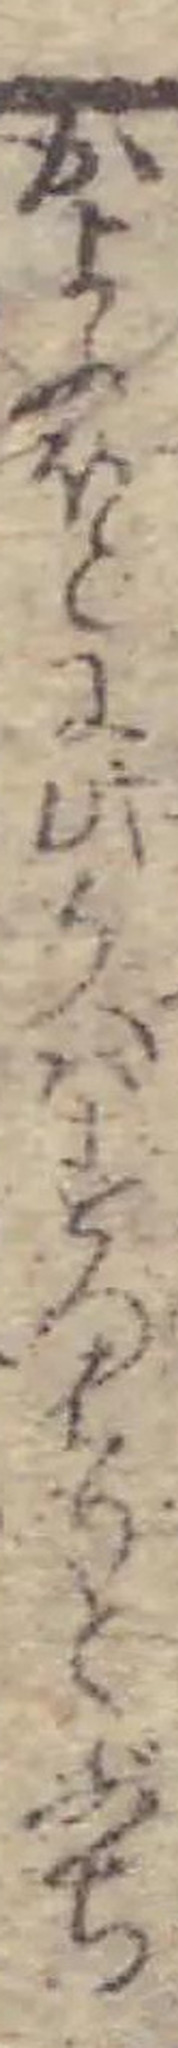かよふほとに此かへはすつはりとぶち
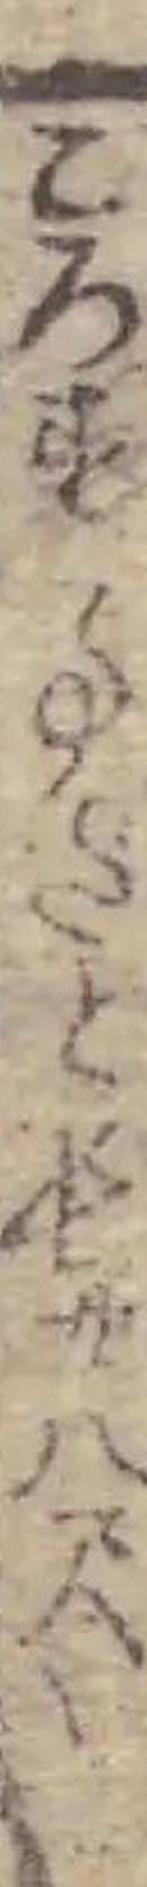ころす事たと長さ八尺
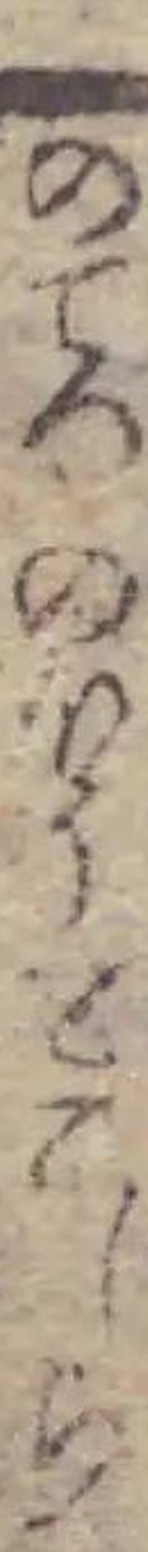のてつほうをこしらへ
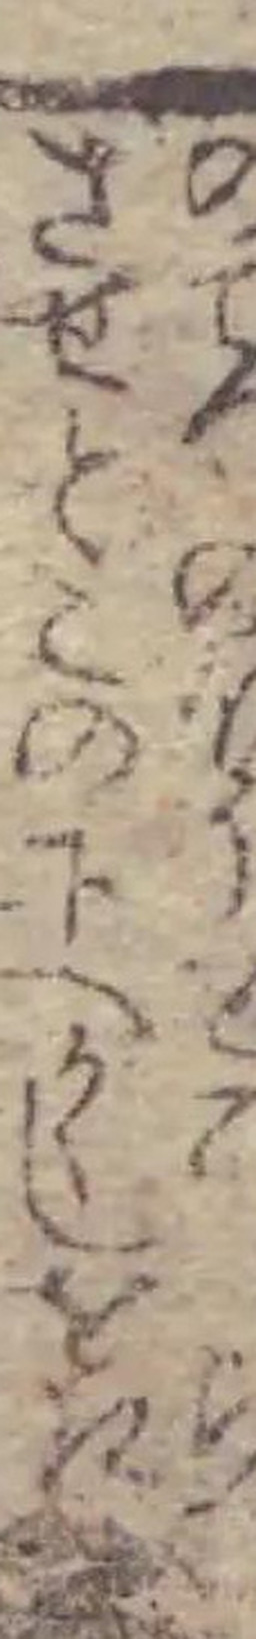させとこの下へかくしをき
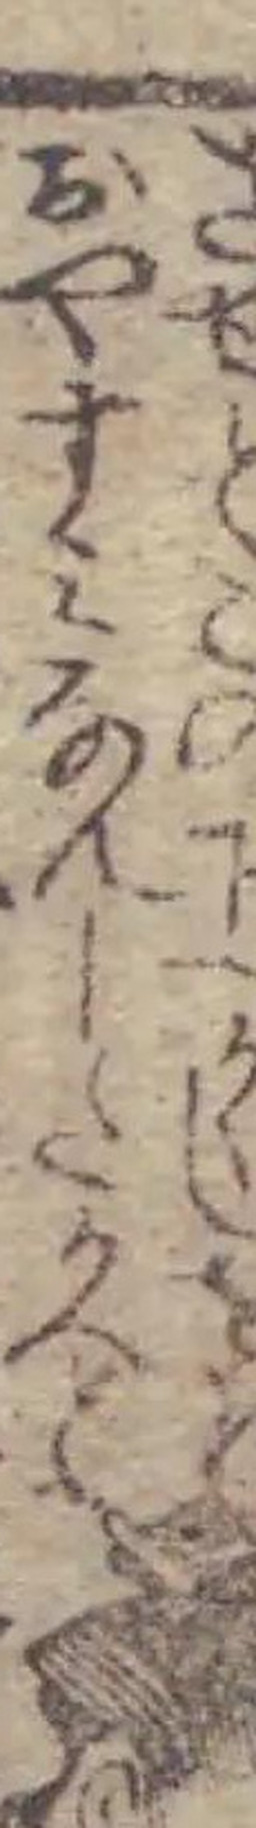おやすみなんしたかへ
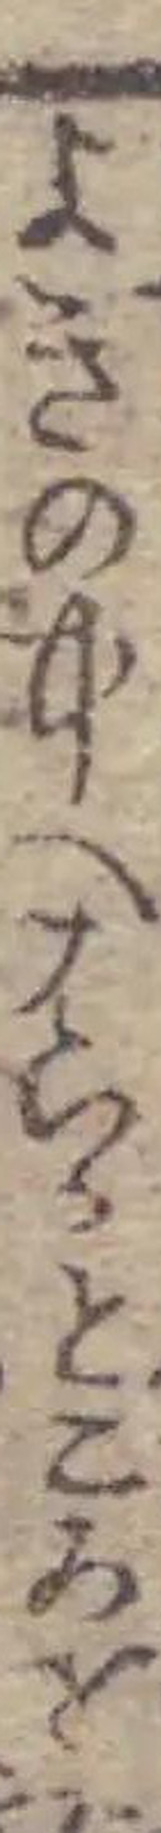よきの中へはいるところを
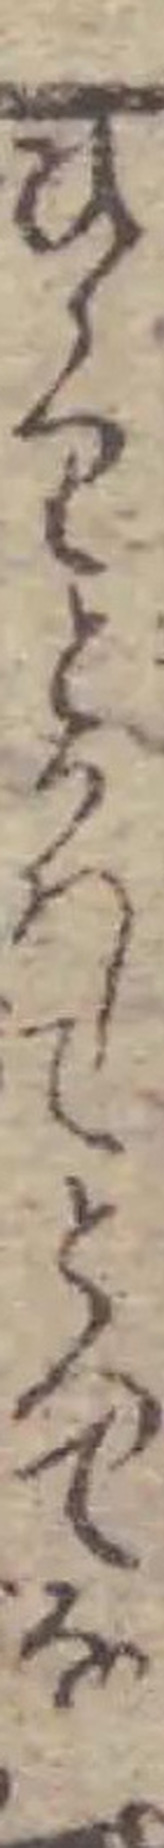ひらりとかはしてとつてな
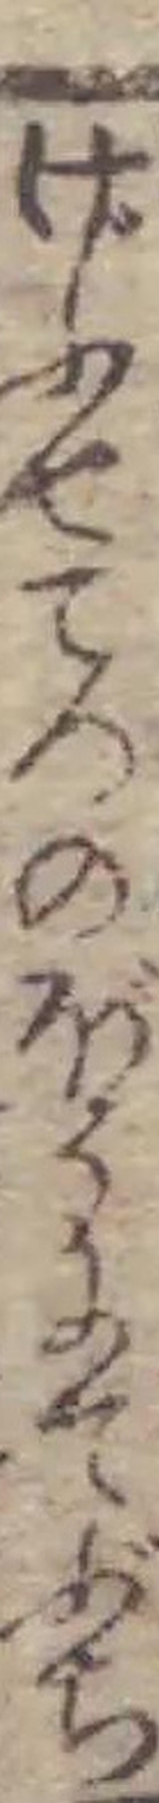げふせてつのぼうにてぶち
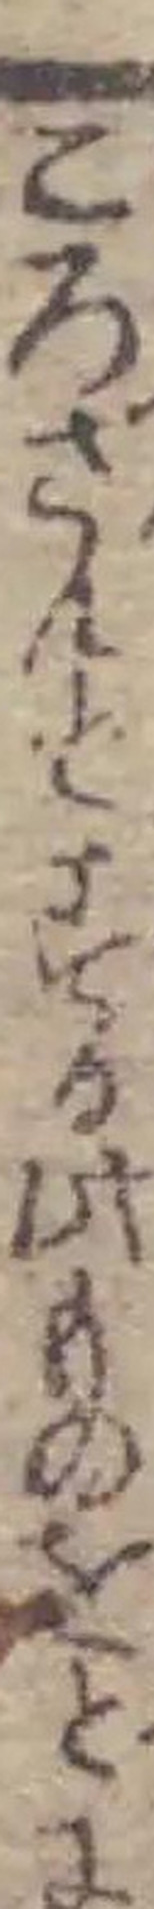ころさんとする此ものをとに
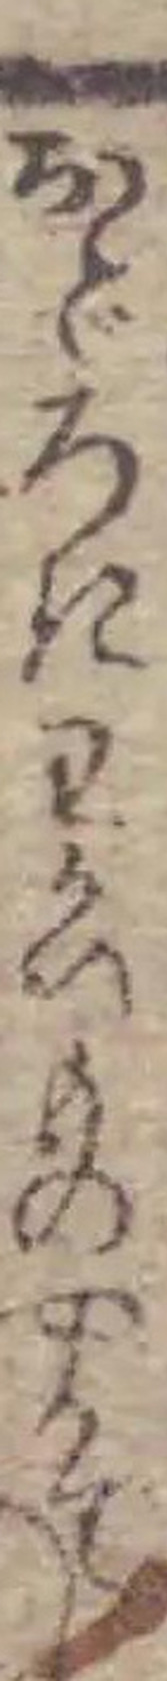おどろきわかいものやかて
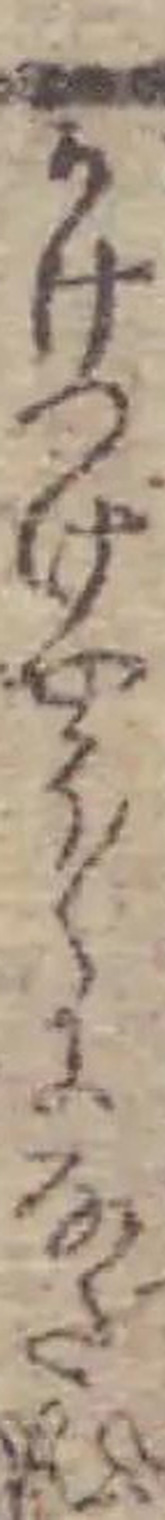かけつけやう〳〵になた
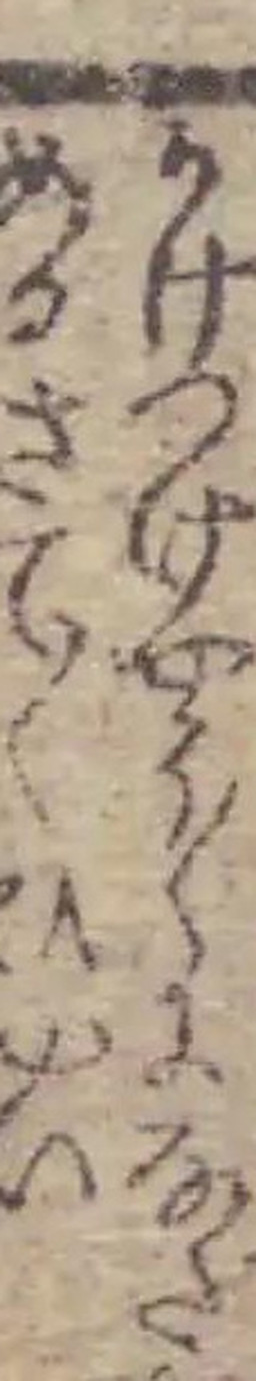めるさて〳〵ひやい
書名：色男其処此処 3巻
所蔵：国立国会図書館 National Diet Library, JAPAN
